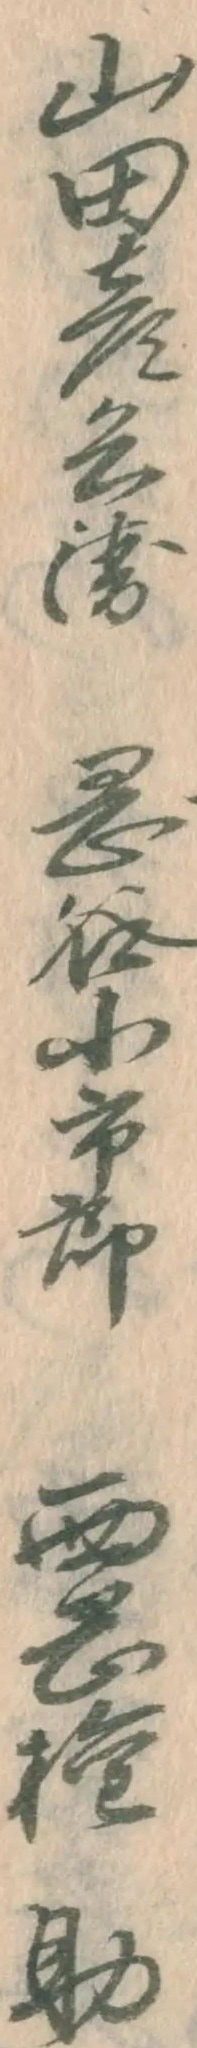山田彦兵衛岡谷小市郎西岡権助

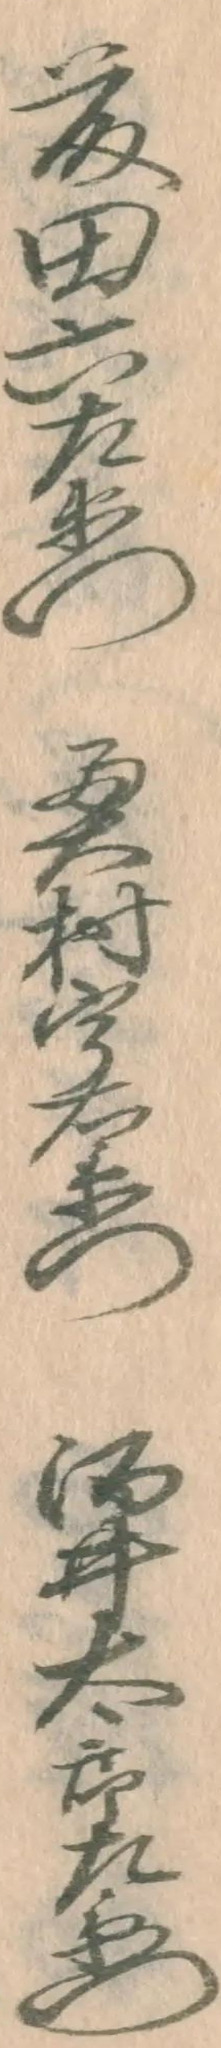藤田六左衛門奥村宇右衛門酒井太郎左衛門
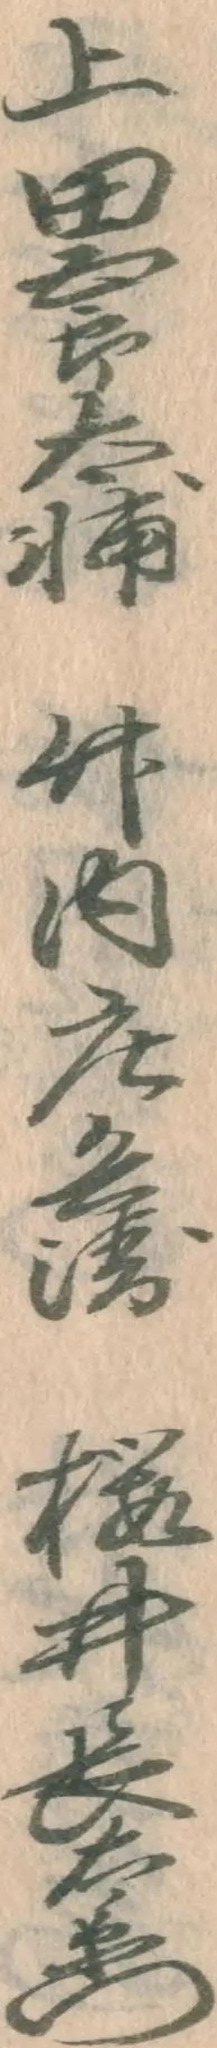上田五郎太輔竹内庄兵衛桜井長右衛門
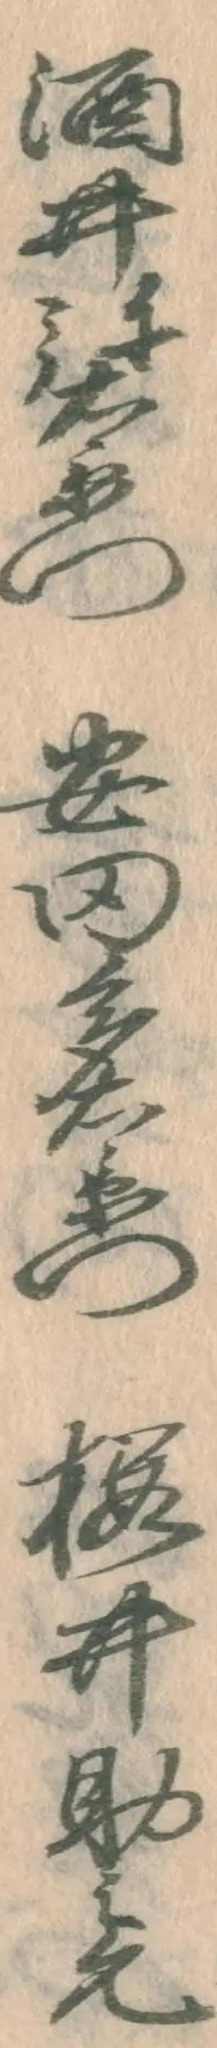酒井弥右衛門安田多右衛門桜井助之允
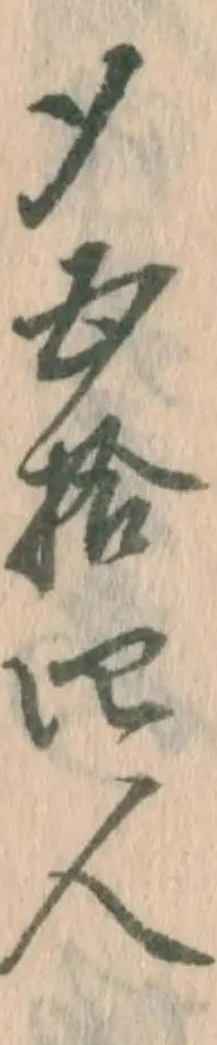〆五拾四人
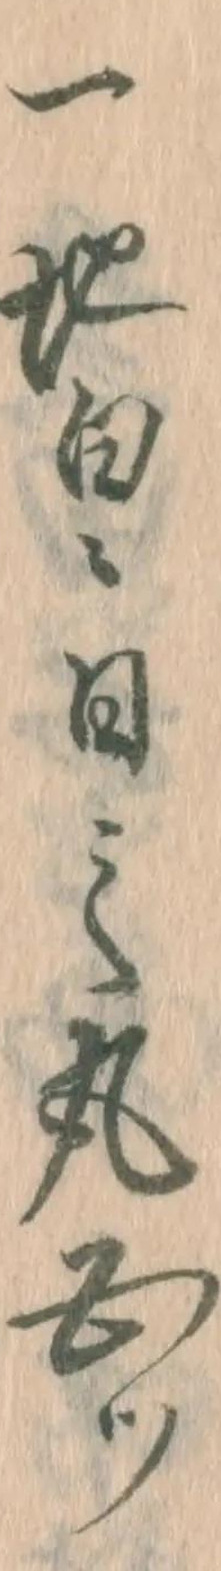一地白に日之丸五つ
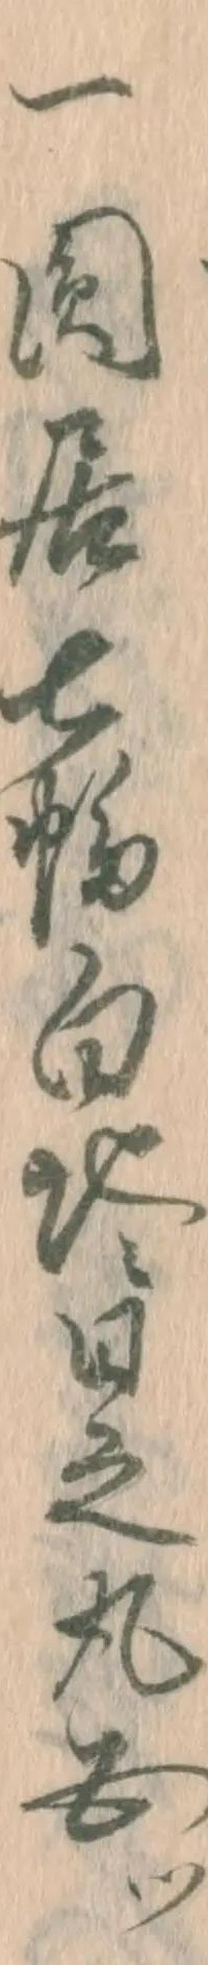一閑居七幅白地に日之丸五つ
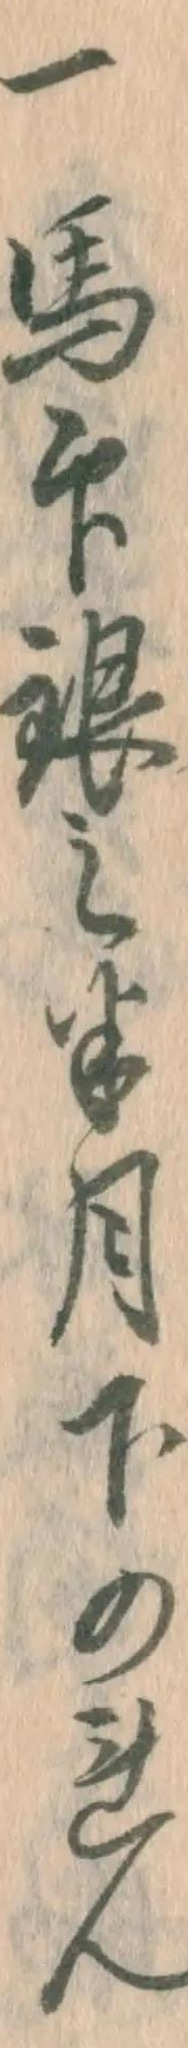一馬印銀之半月下の連ん
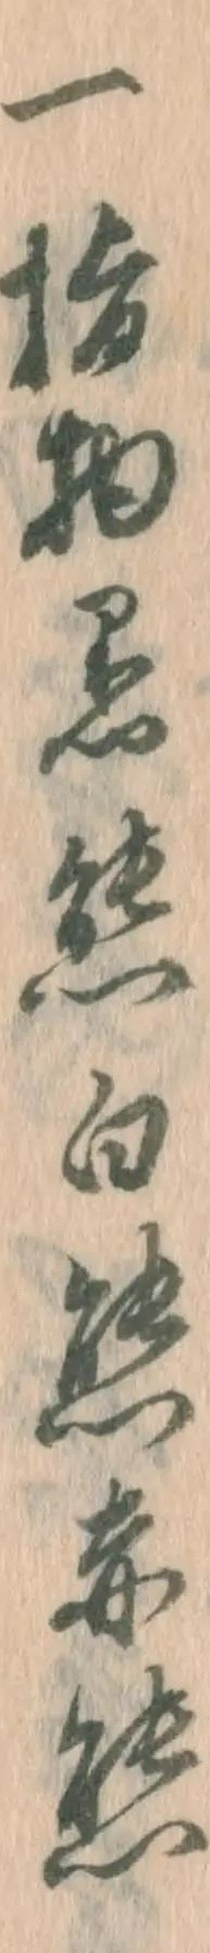一指物黒熊白熊赤熊
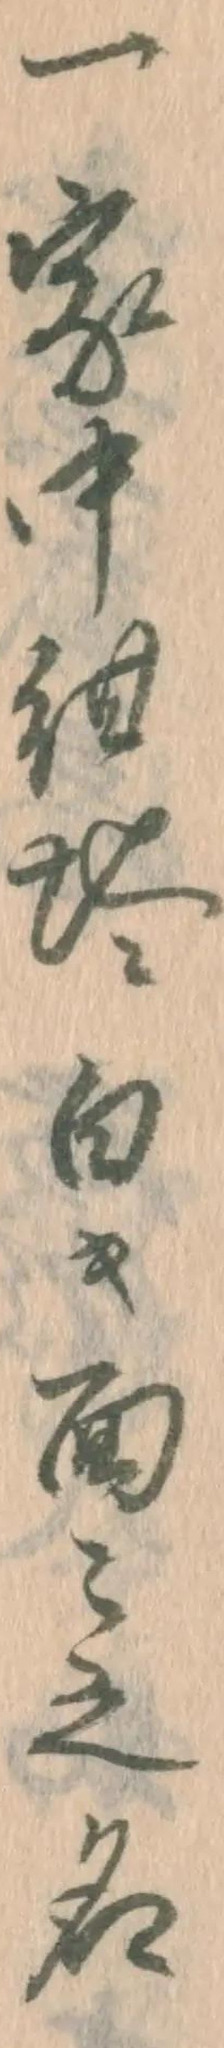一家中紺地に白き面々之名

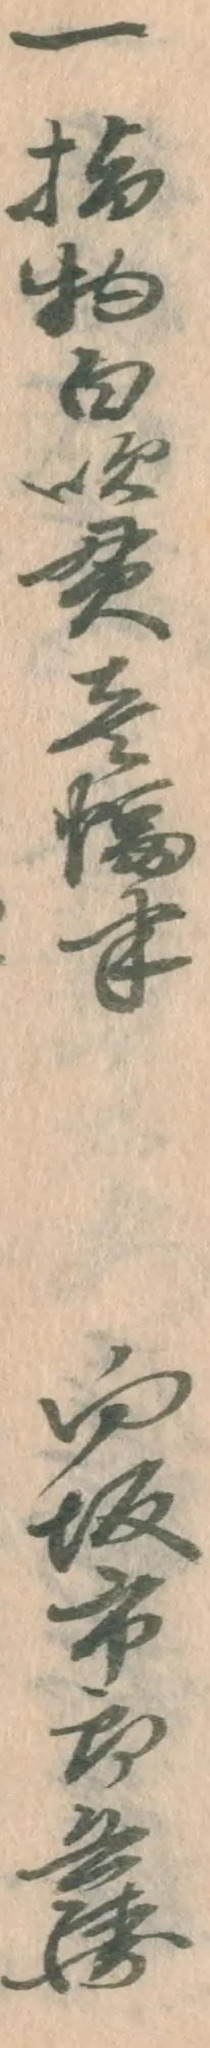一指物白吹貫壱幅半向坂市郎兵衛
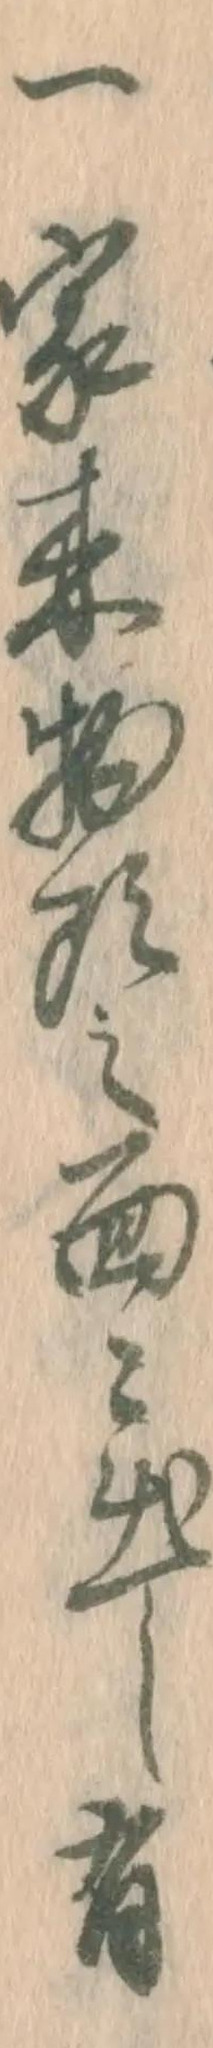一家来物頭之面々出し有
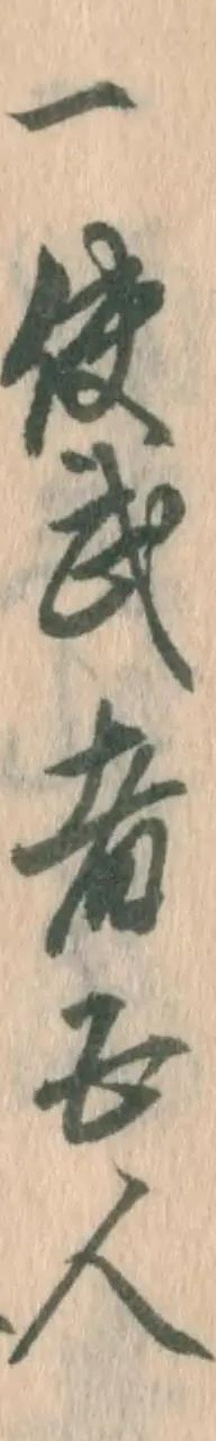一使武者五人
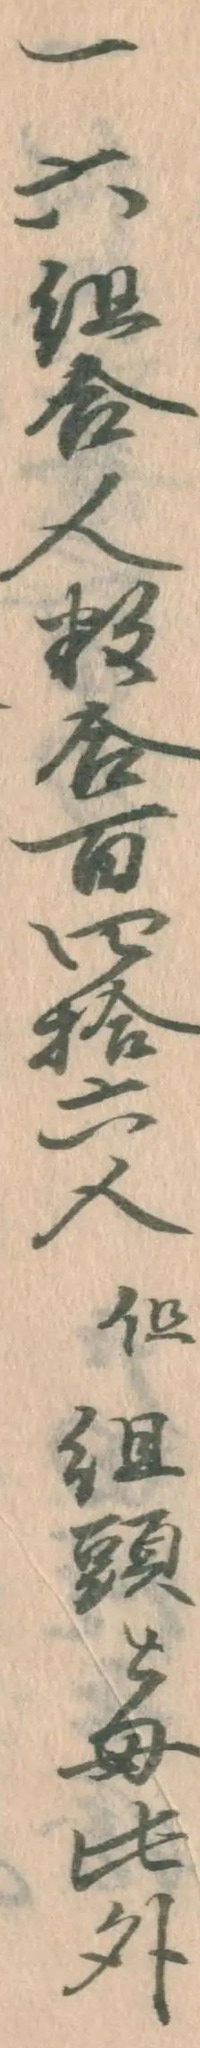一六組合人数合百四拾六人但組頭と母此外
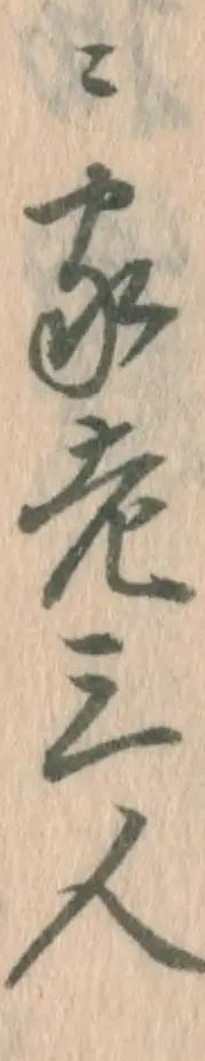に家老三人
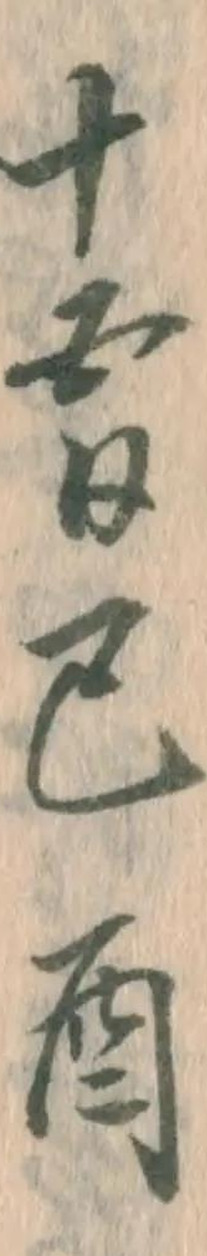十五日己酉
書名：切支丹御退治記 49巻. [4]
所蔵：国立国会図書館 National Diet Library, JAPAN
